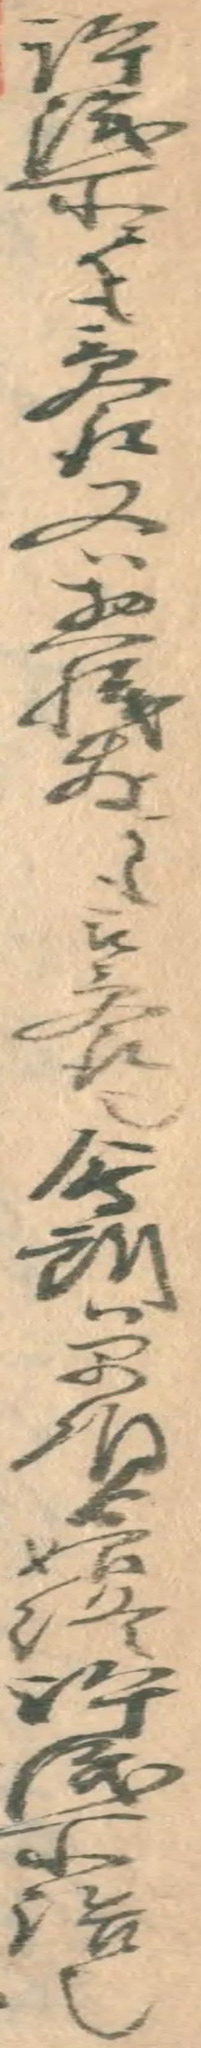評議所ニても受取又ハ惣桟敷ニても被受取也会所ハ早朝ゟ始終評議所詰也
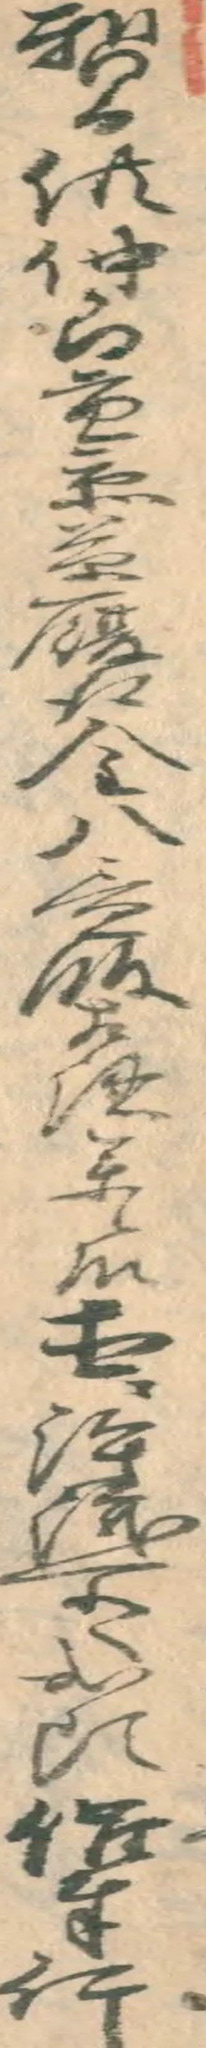一暫而供仲間市兵衛草履取金八昼飯相認参候故直ニ評議所へ出頭催奉行
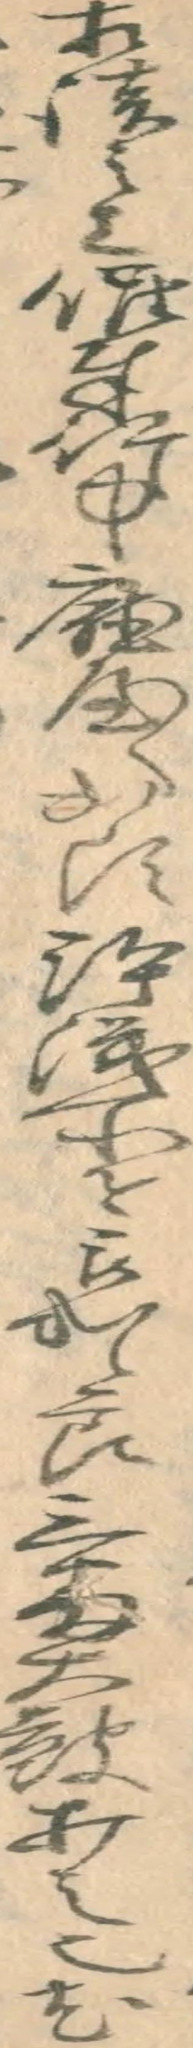相談之上催奉行中庁屋へ出頭評議所を被出候節三番大鼓打之也尤
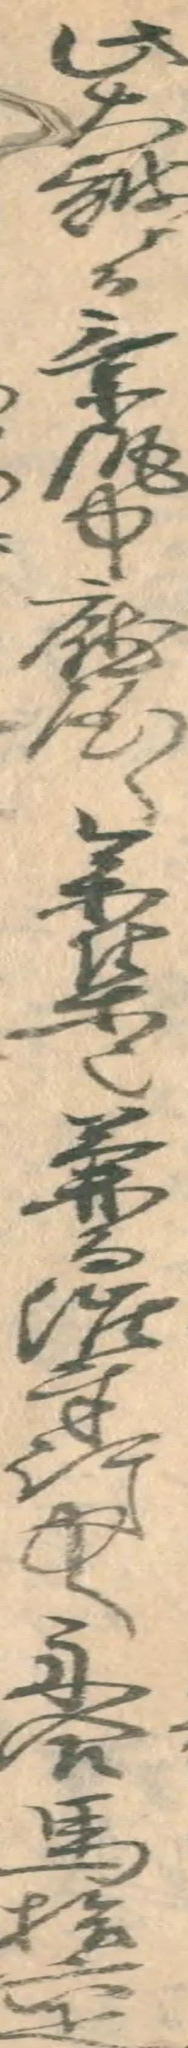此大鼓ニ而乗尻中庁屋へ参集也兼而催奉行中へ示合馬拾六疋
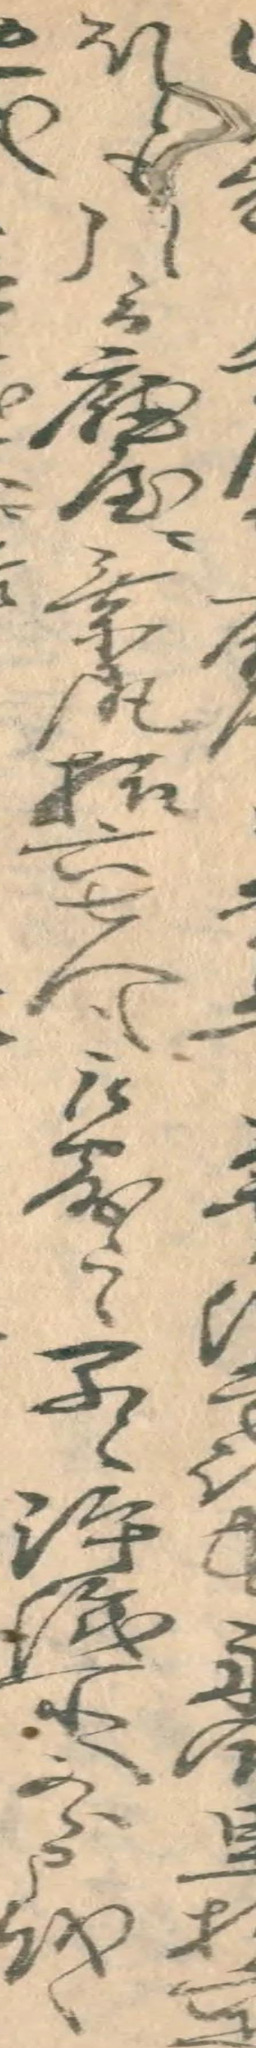ほとも引候而庁屋ニ乗尻拾六七人も被寄候ハヽ早々評議所へ可被申越候
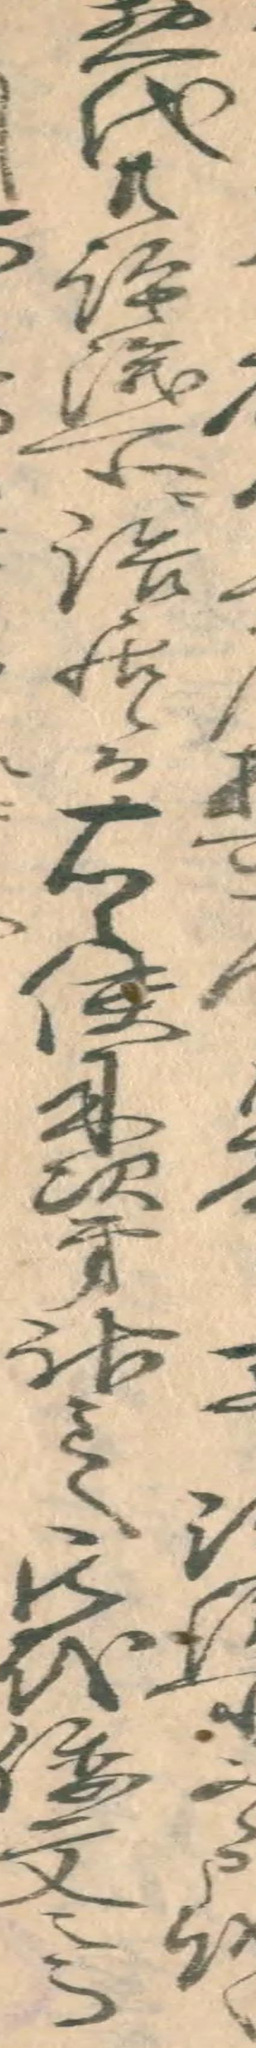惣代共評議所ニ詰居候而右之使来次第神主へ罷越倭文之馬
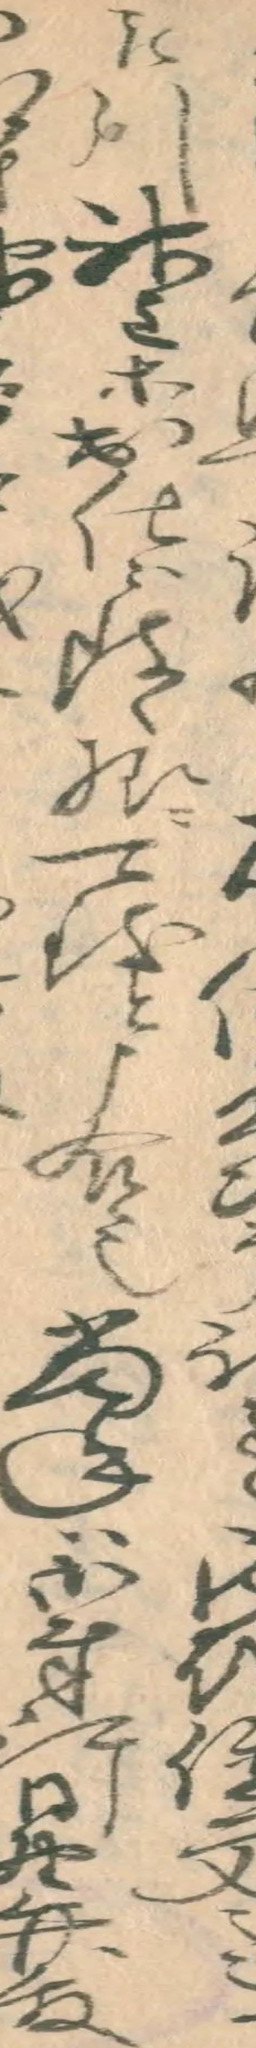被引神主等出仕被致候様ニ可致と申合候也当年ハ御奉行日野弁殿
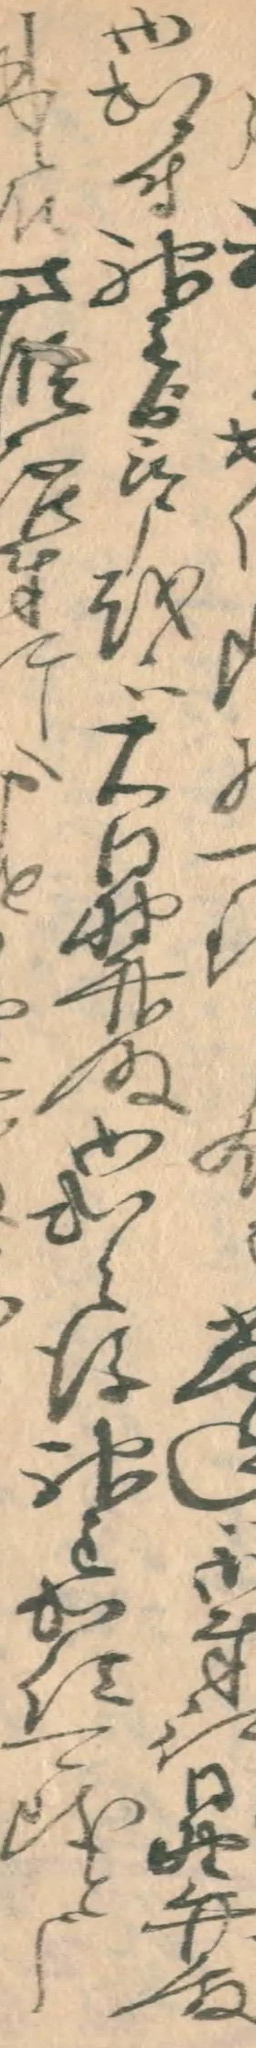御出ニ付神主ゟ被申越候ハ右日野弁殿御出之後神主出仕可致と申
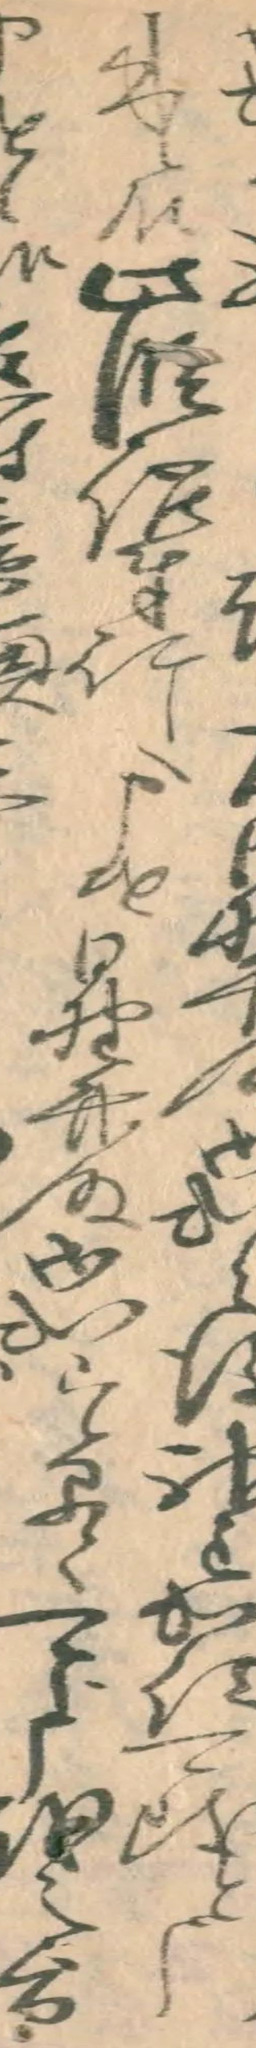来候故此段催奉行へ申遣日野弁殿御出候ハヽ早々可被申越之旨
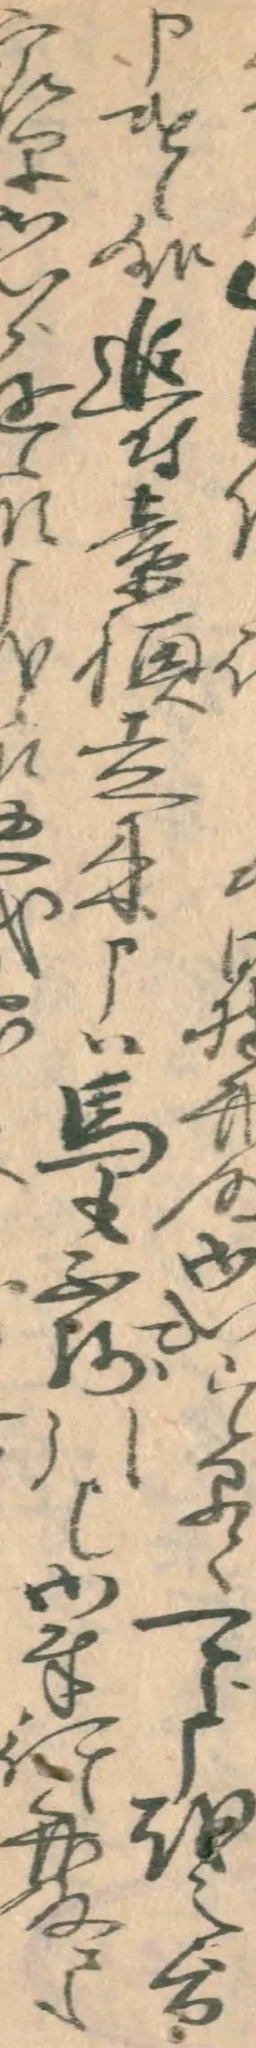申遣候処追付素襖走来申ハ馬も不残引申候御奉行弁殿ニも
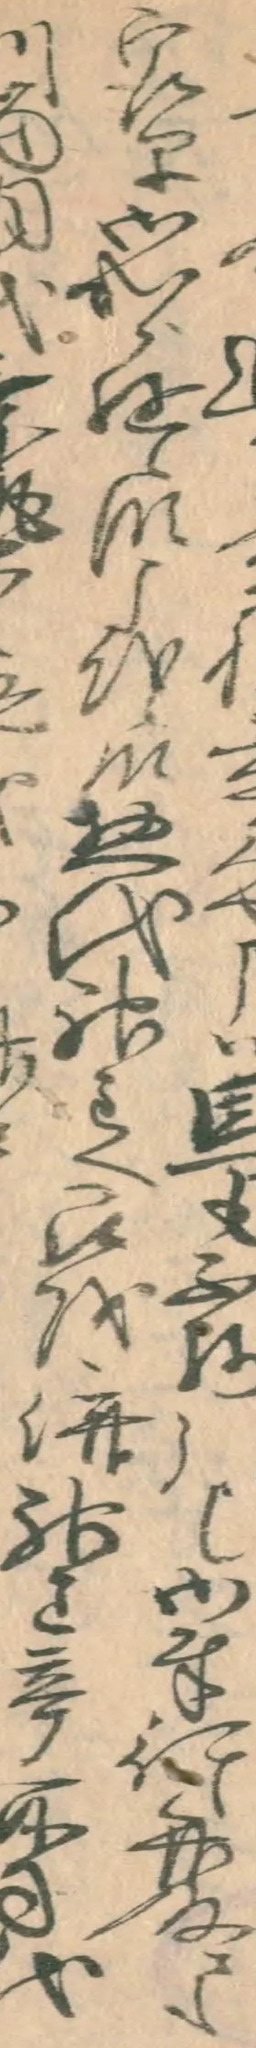最早御出被遊候段申越候故惣代神主へ罷越候併神主亭所司代
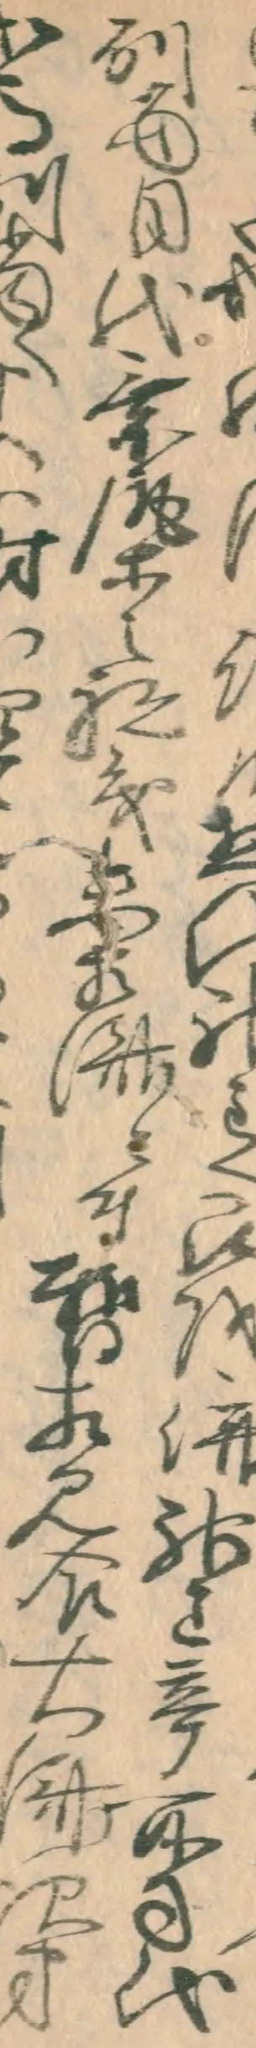別当目代乗尻等之祝義未相済ニ付暫相見合右済次第
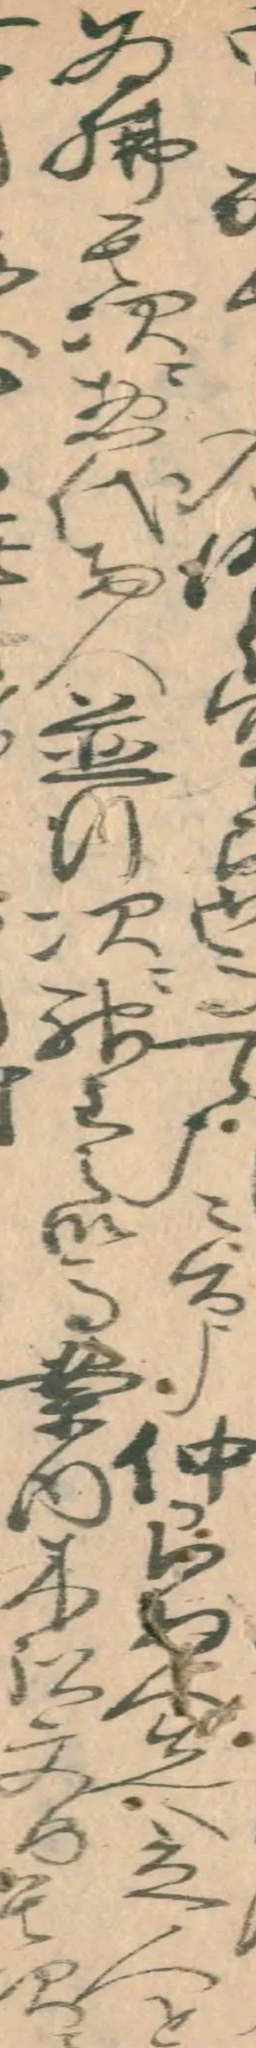為払其次ニ惣代両人並行次ニ神主之御馬案内木船文右衛門其次ニ
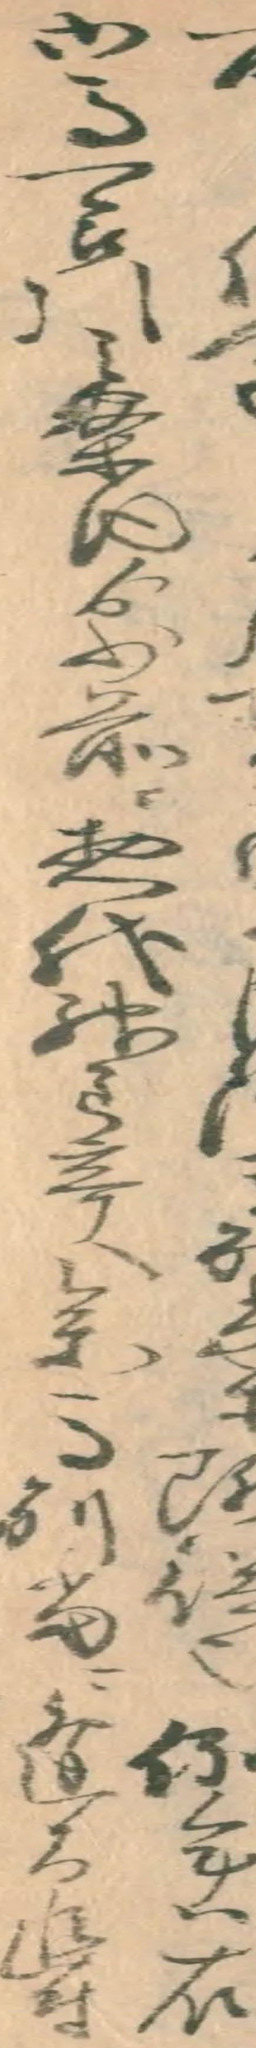御馬可被引之案内ゟ少前ニ惣代神主亭へ参馬別当ニ逢候而追付
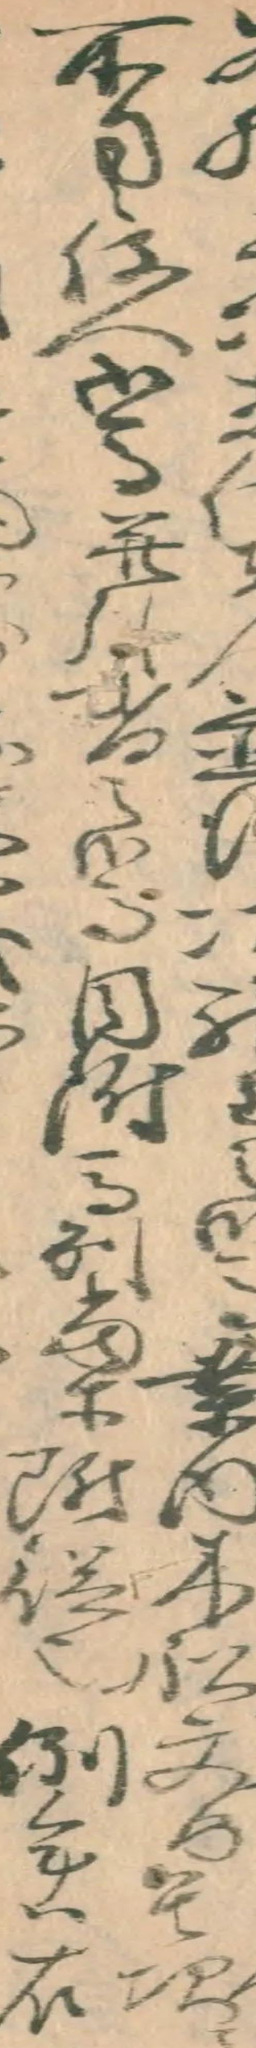所司之役人御馬幷引替之御馬目付馬別当等付従也例年ハ右
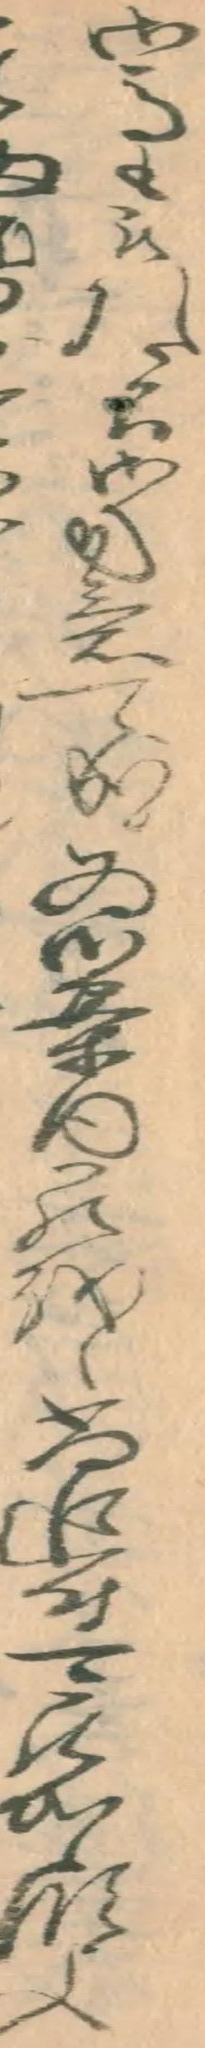御馬も被引候間御用意可被成候為御案内罷越候尚追付可罷出候段申入
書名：賀茂社記録. 第58冊
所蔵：国立国会図書館 National Diet Library, JAPAN
